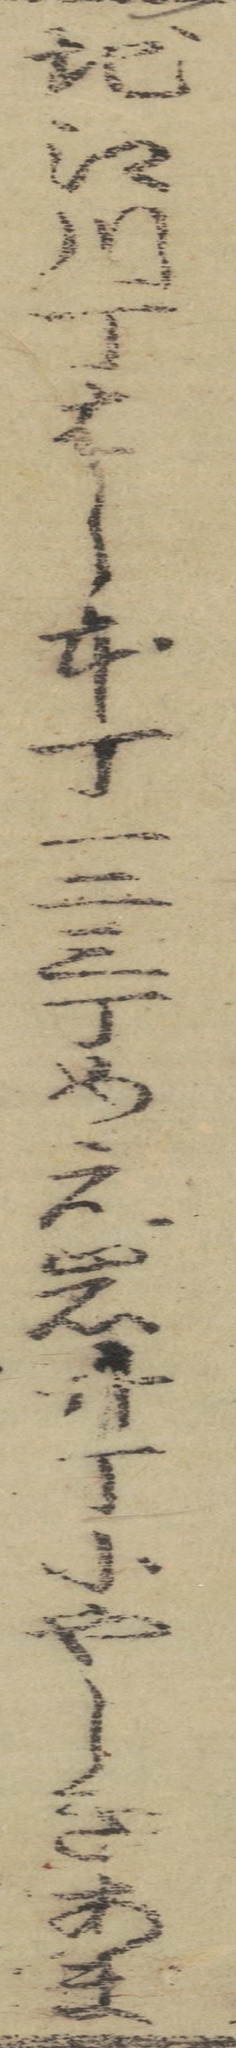地江川丁はし本丁一二三丁め元岩井丁小やしきあま
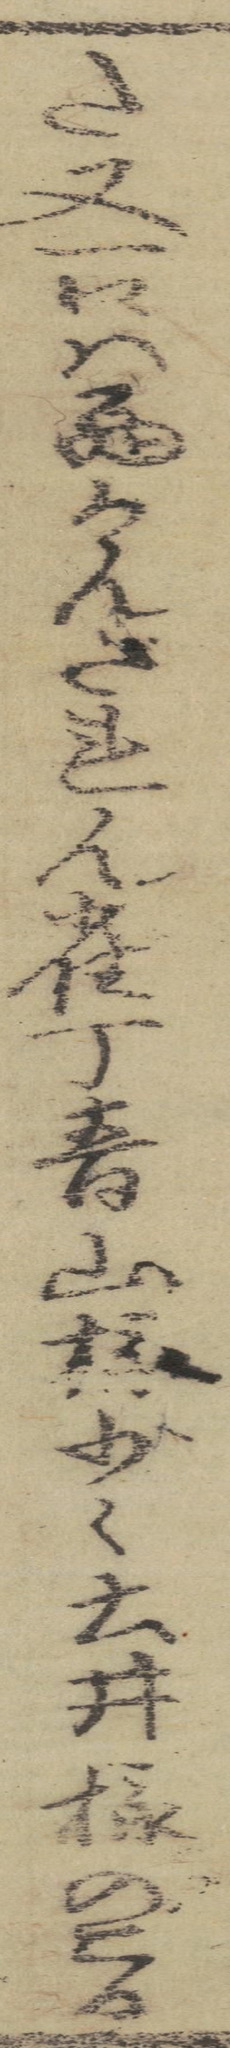た又一口は西かんたれん雀丁青山様少し土井様のこる
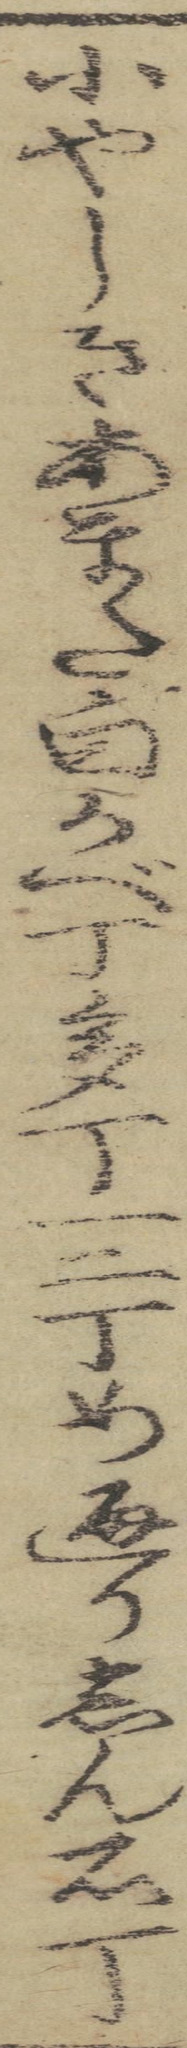小やしきあまた白かべ丁多丁一二丁め通りしん石丁
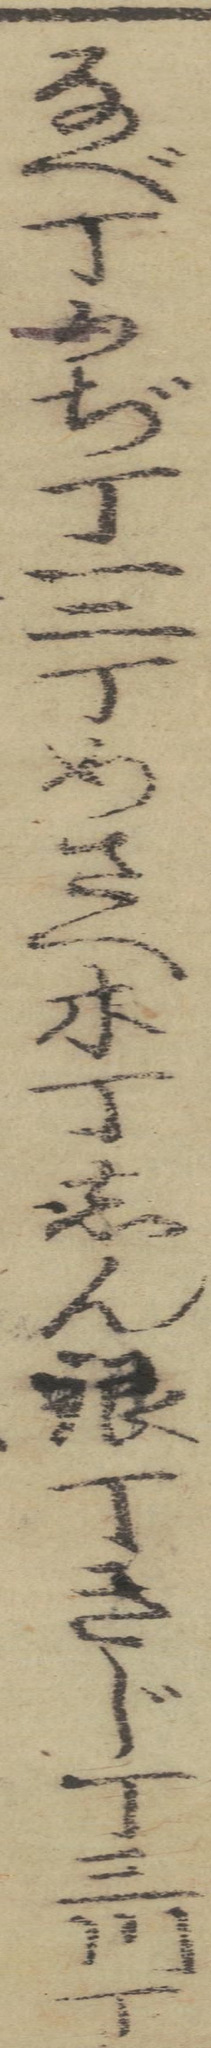なべ丁かぢ丁一二丁めさへ木丁しん銀丁きじ丁三川丁
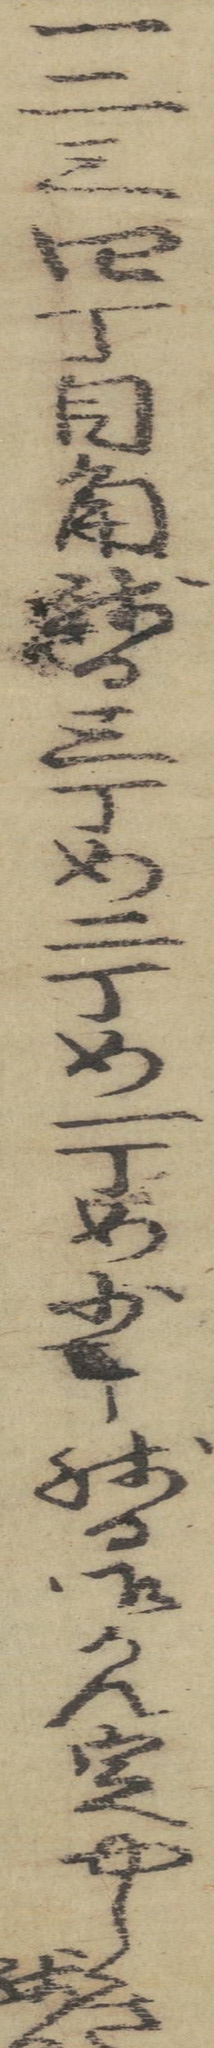一二三四丁目角残る三丁め二丁め一丁め少し残る御かん定やしき残る
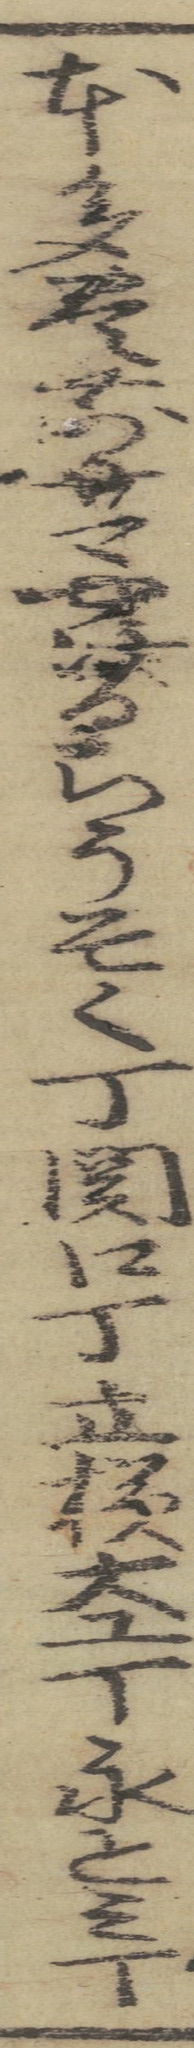本多豊前サマやけるらうそく丁関口丁立横大工丁永とみ丁
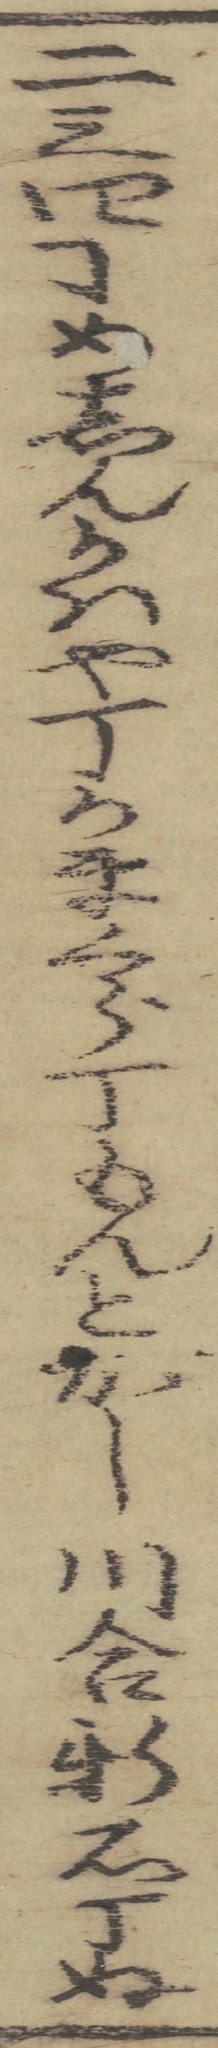二三四丁めしんかはや丁かまくら丁もんとがし川合新石丁ぬ
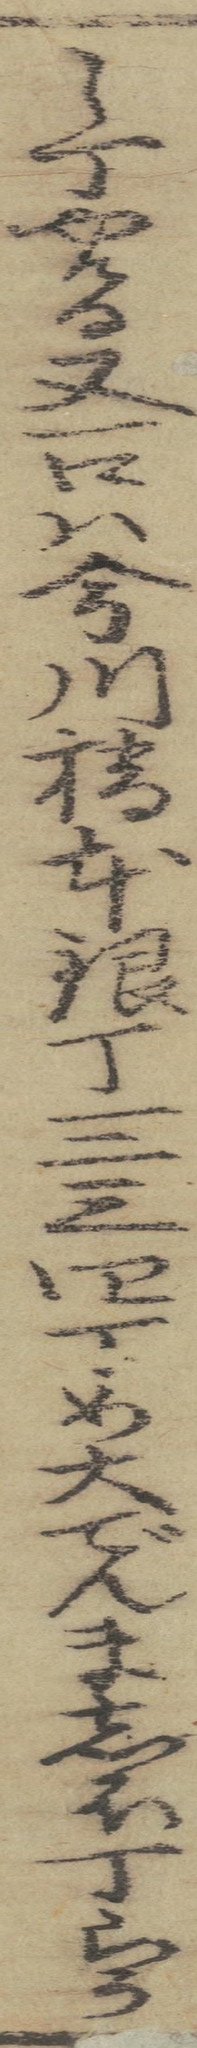し丁やける又一口は今川橋本銀丁一二三四丁め大でんましほ丁らう
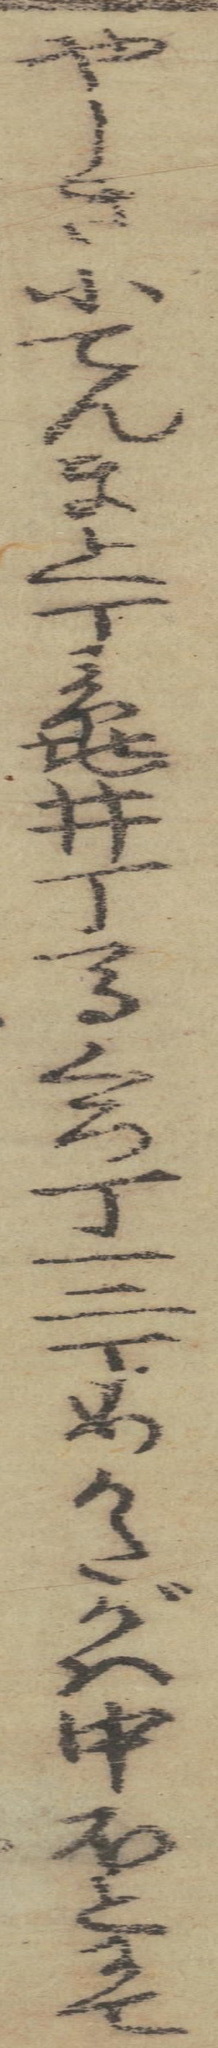やしき小てんま上下亀井丁馬くろ丁一二丁めかたがは中ほとにて
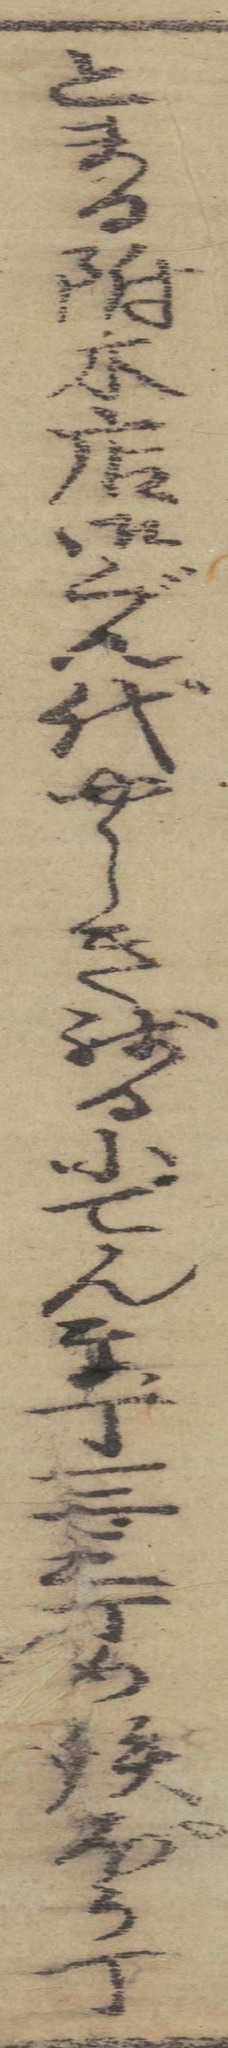とまる附木店御ぐん代やしき残る小でんま丁一二三丁め鉄ぽう丁
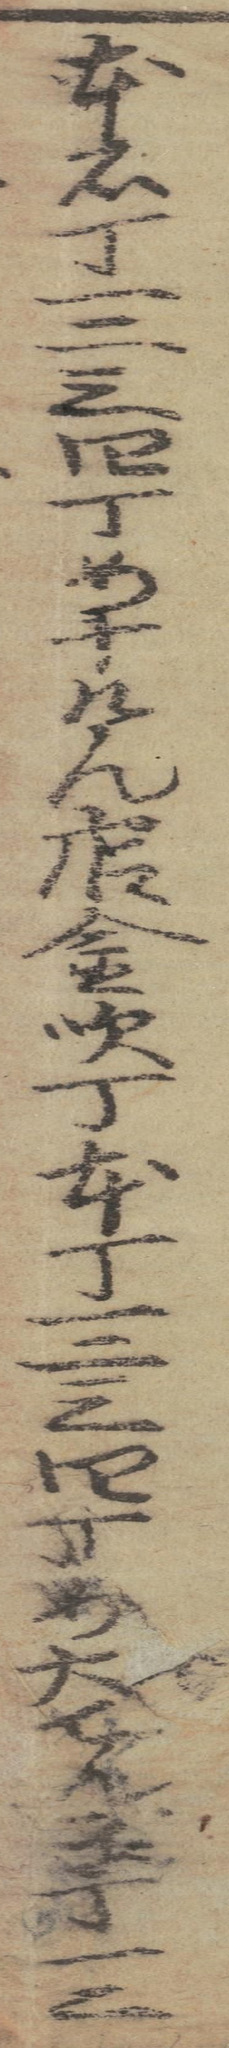本石丁一二三四丁め十けん店金吹丁本丁一二三四丁め大でんま丁一二
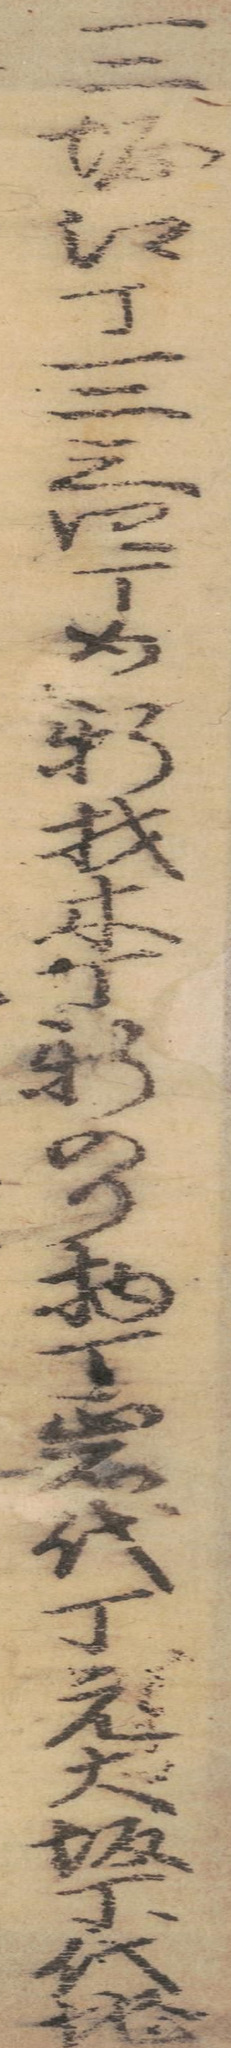一二堀江丁一二三四丁め新材木丁新のり物丁岩代丁元大坂丁代地
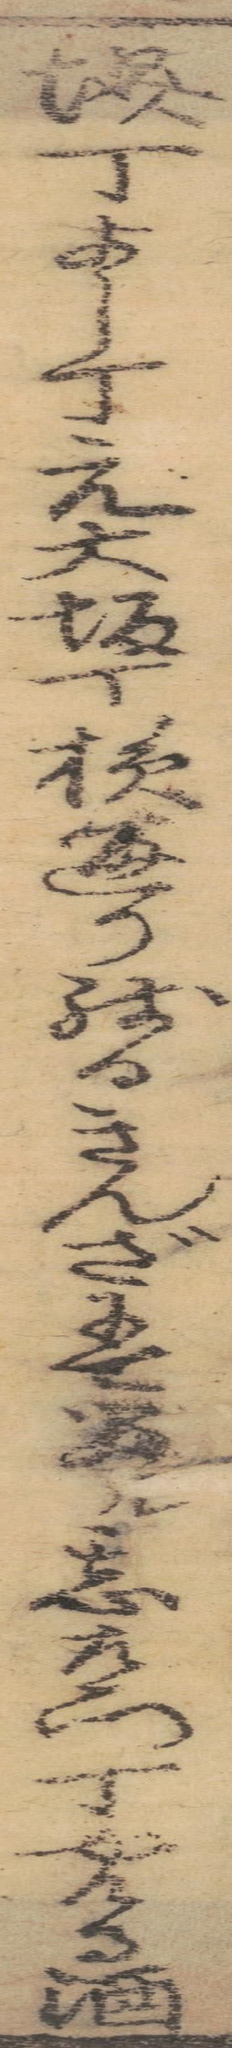堺丁よし丁元大坂丁横通り残るきんざにて留ル甚左衛門丁やける酒
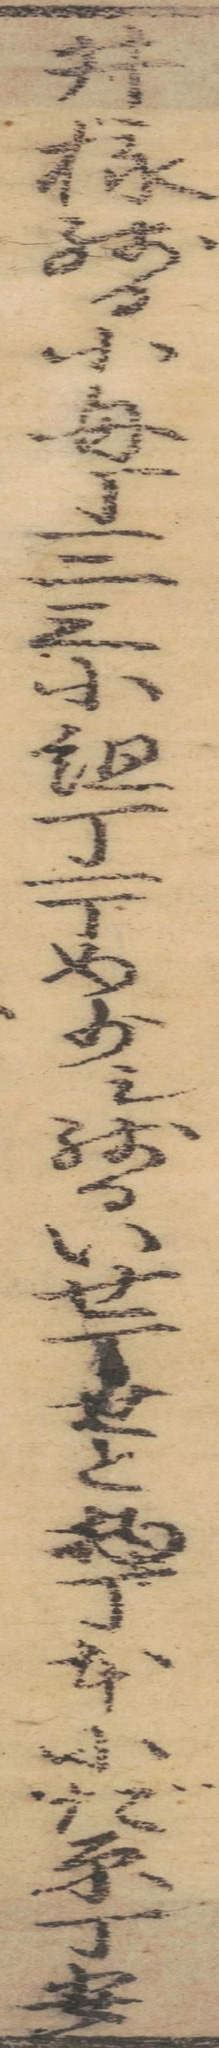井様残る小舟丁一二三小網丁一丁め少シ残るいせ丁せと物丁本小だ原丁安
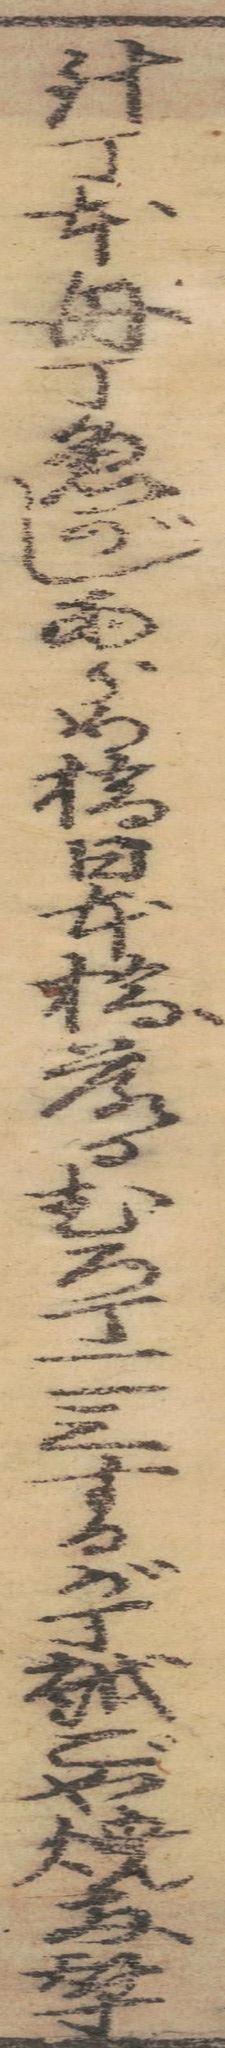針丁本舟丁魚がしあらめ橋日本橋落るむろ丁一二三するが丁越ごや焼両替丁
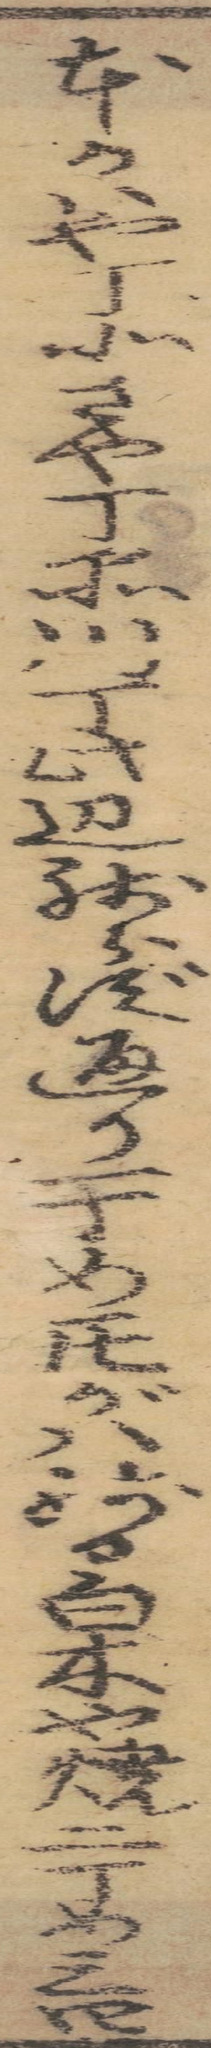本かはや丁北さや丁品川丁此辺残らず通り一丁め片がは残る白木や焼二丁め三四
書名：[安政五年十一月の江戸大火に関する瓦版]
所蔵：東京大学地震研究所図書室 Earthquake Research Institute Library, The University of Tokyo, JAPAN
